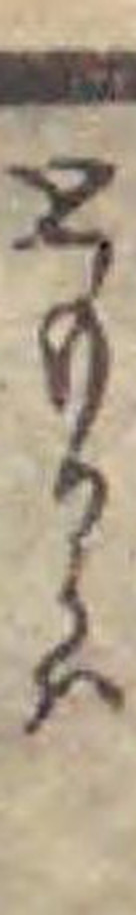ものからは
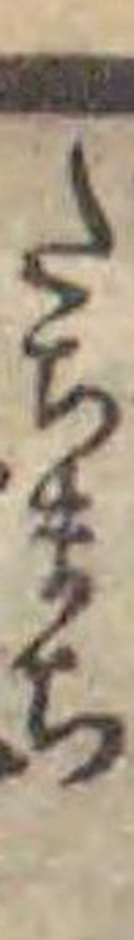たちまち
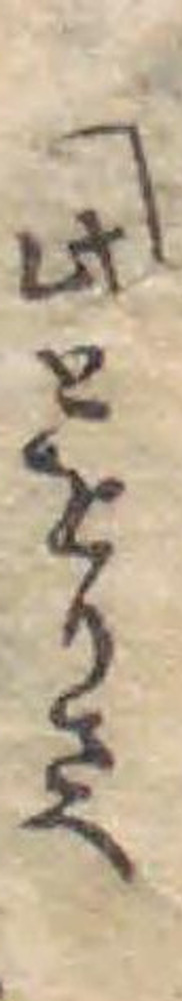〽此とをりさへ
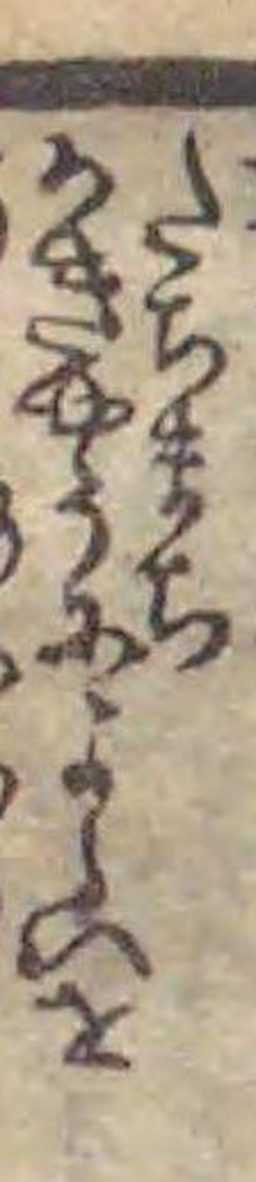かきやうによらいを
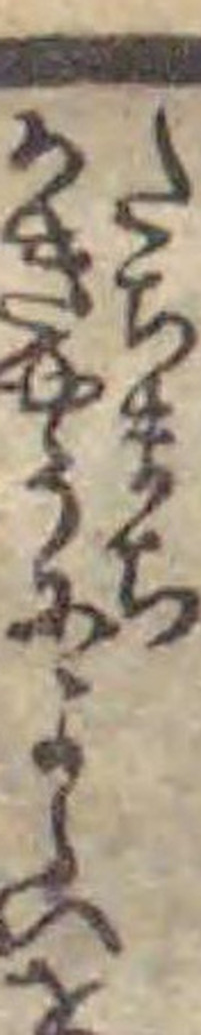かきやうによらいを
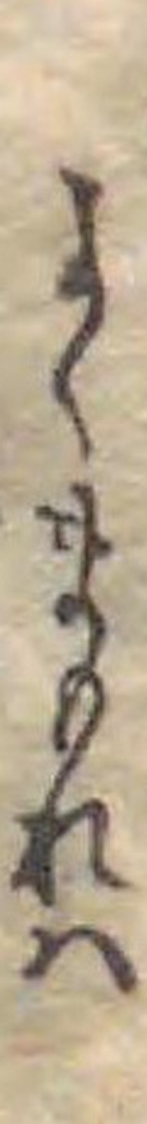よくまもれは
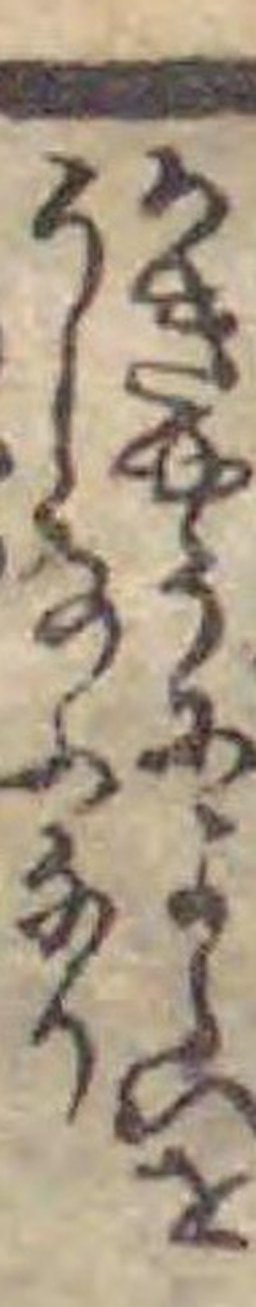うしなふなり
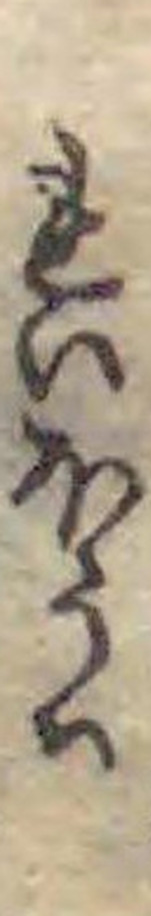れいほうは
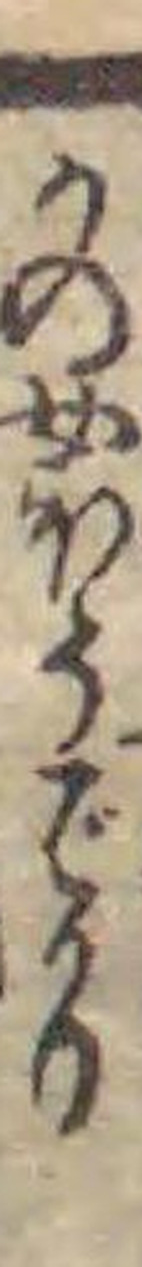かの女ほうばかり
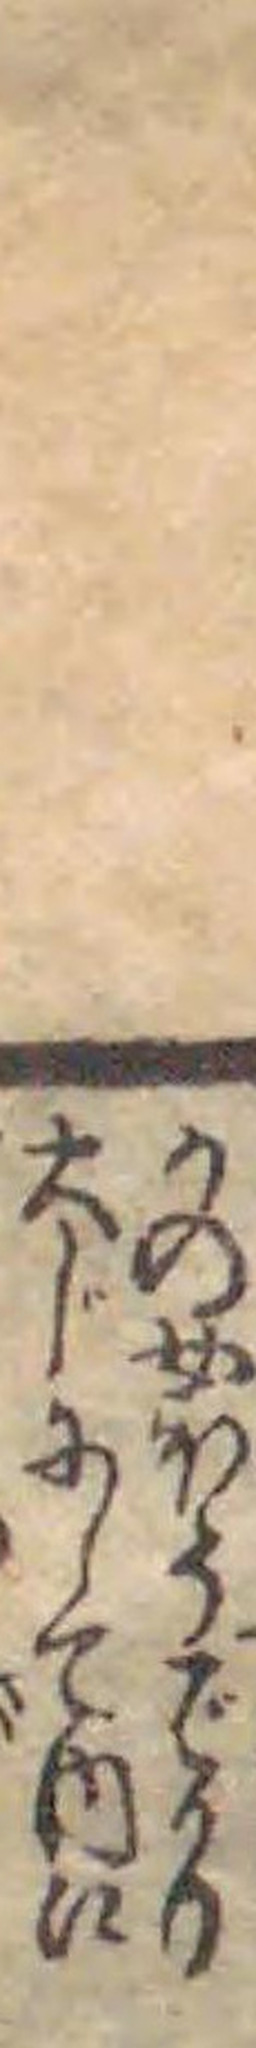大じにして内に
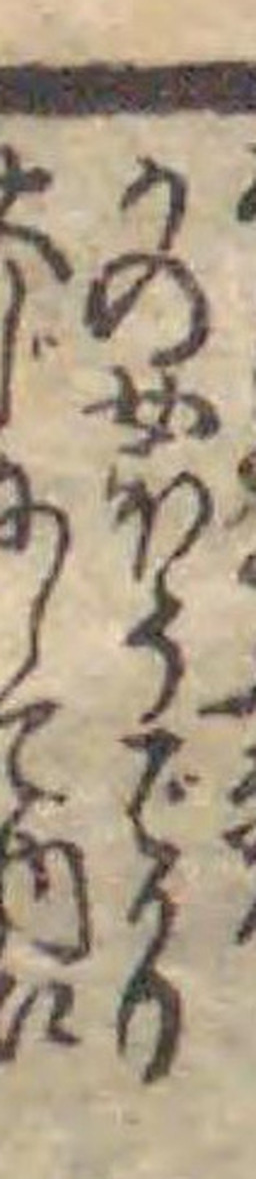大じにして内に
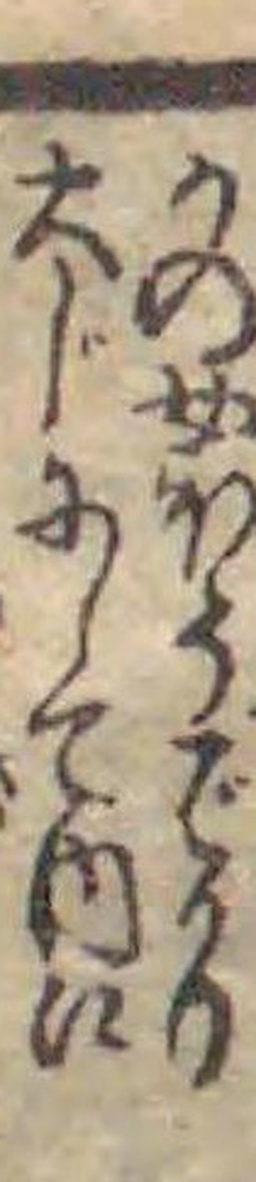大じにして内に
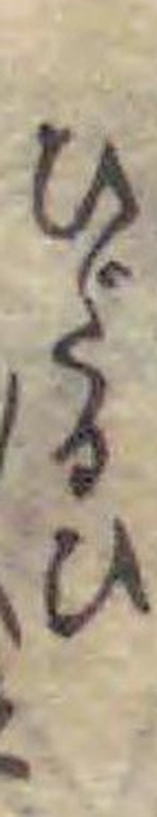ひだるひ
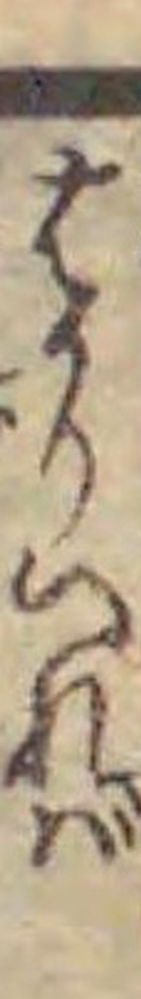はかりいれば
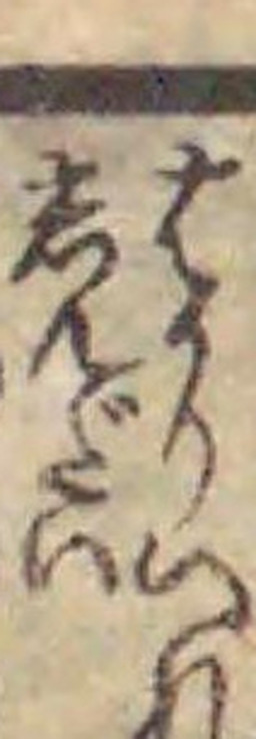しんだい
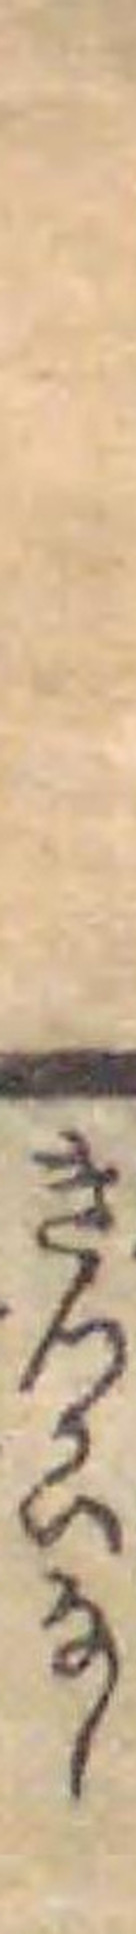きつかいなし
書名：身体開帳略縁起 : 3巻
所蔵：国立国会図書館 National Diet Library, JAPAN
